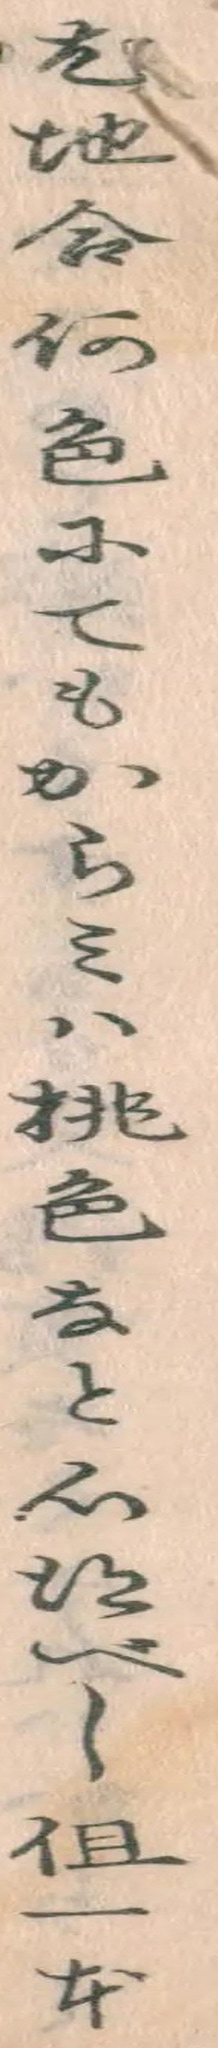尤地合何色にてもからみは桃色なと心得べし但一本
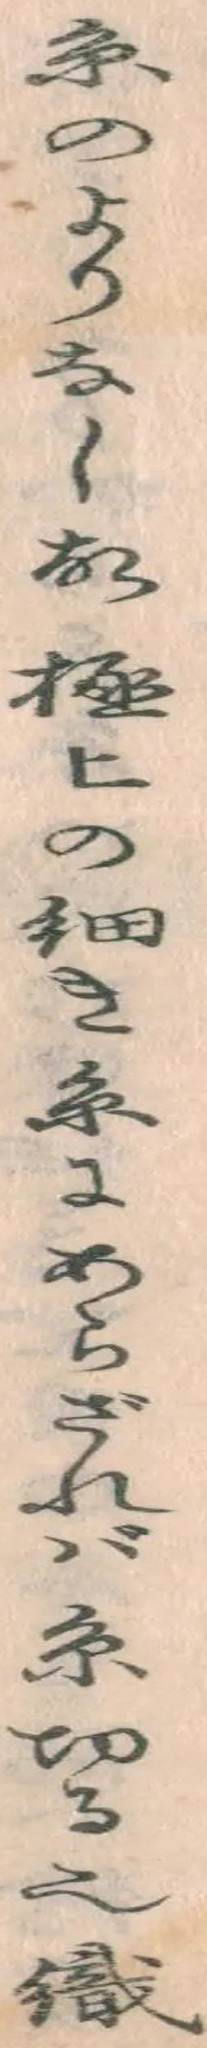糸のよりなし故極上の細き糸にあらざれば糸切る也織
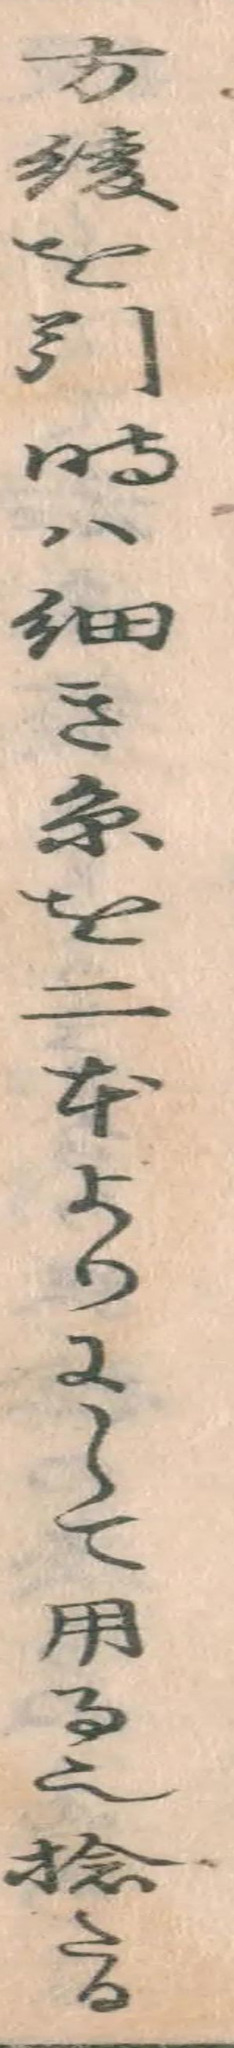方綾を引時は細き糸を二本よりにして用る也捻たる
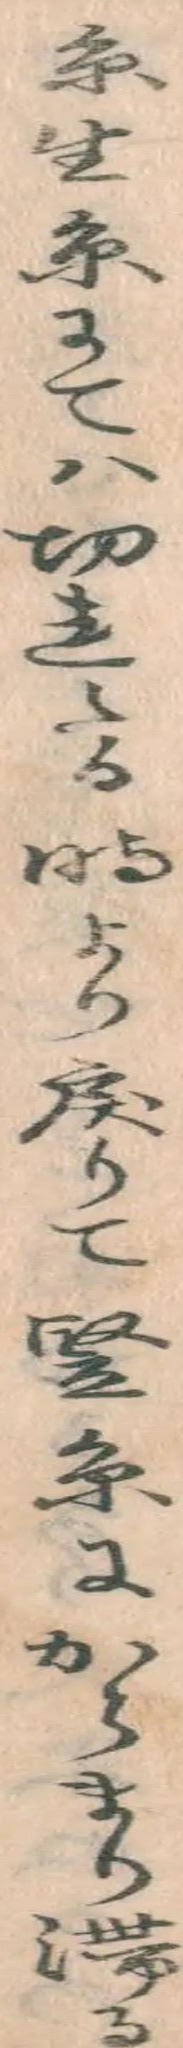糸生糸にては切れたる時より戻りて竪糸にからまり滞る

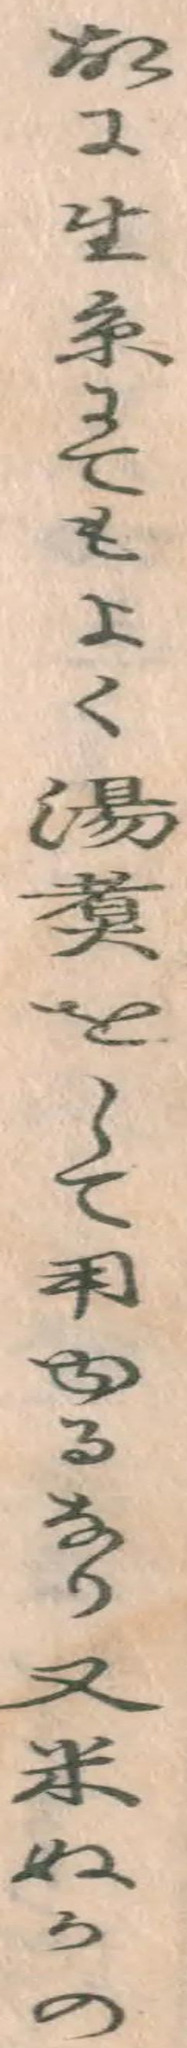故に生糸にてもよく湯煮をして用ゆるなり又米ぬかの
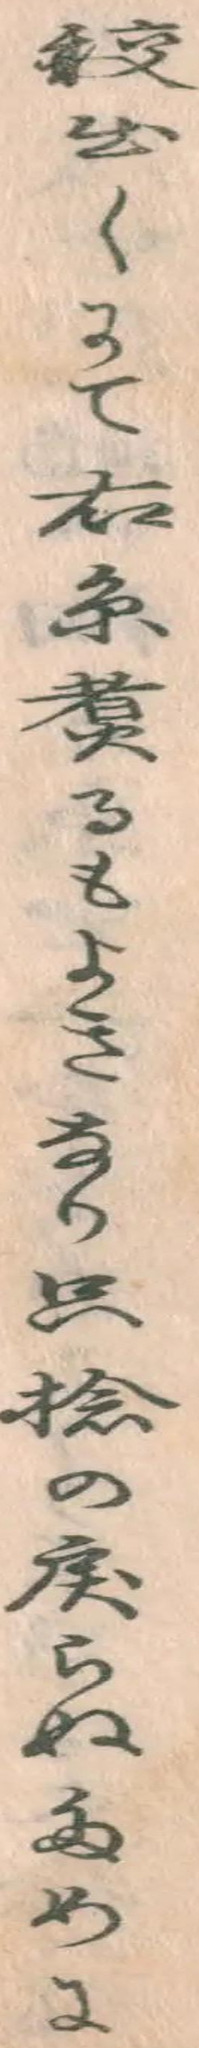絞出しにて右糸煮るもよきなり只捻の戻らぬために
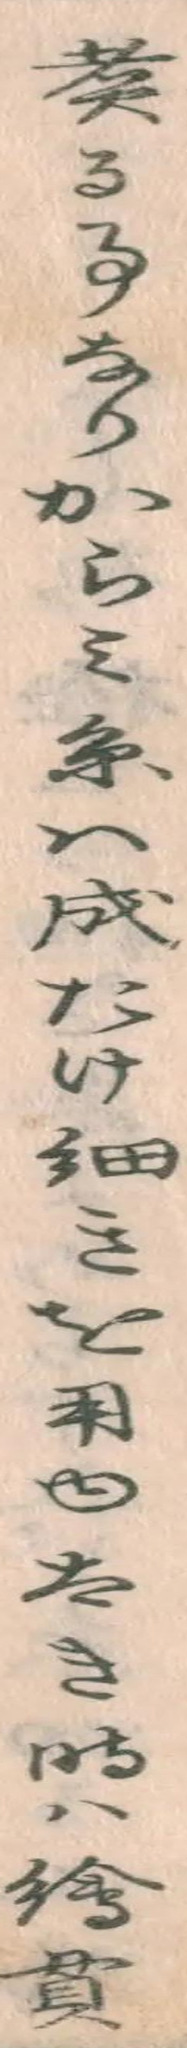煮る事なりからみ糸は成たけ細きを用ゆ太き時は絵貫
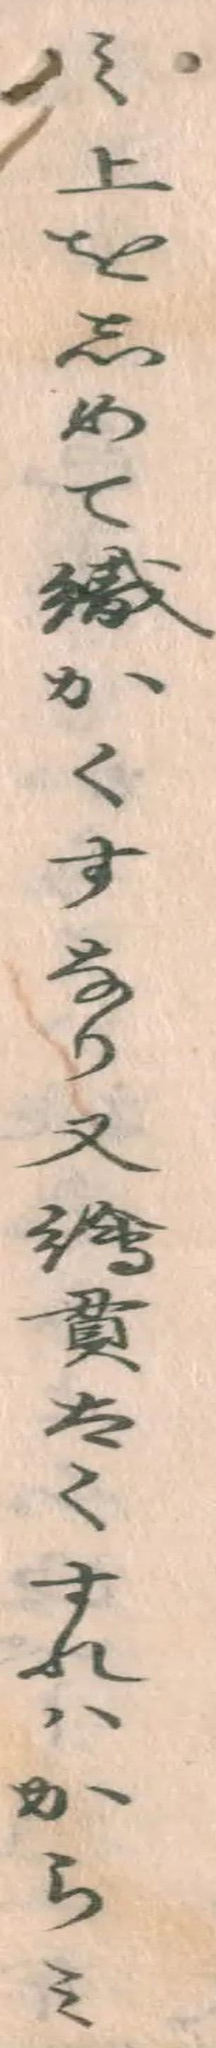之上をしめて織かくすなり又絵貫太くすれはからみ
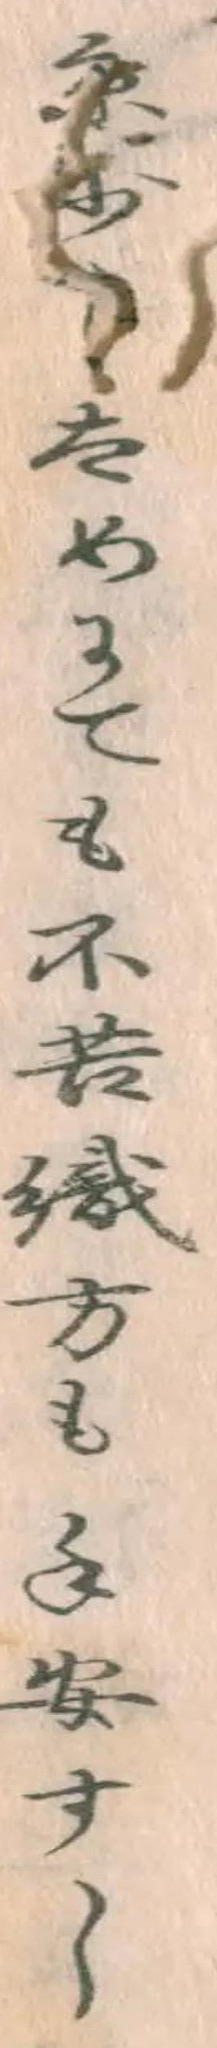糸少し太めにても不苦織方も手安すし
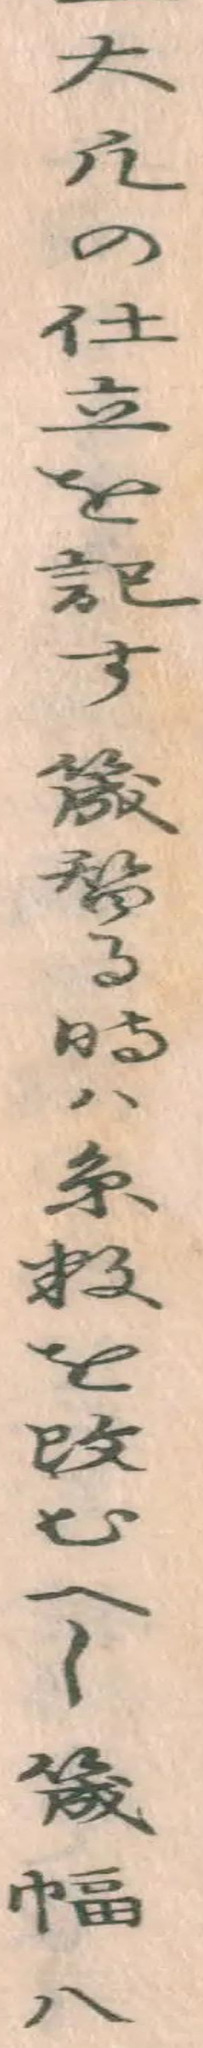一大凡の仕立を記す筬替る時は糸数を改むへし筬幅八
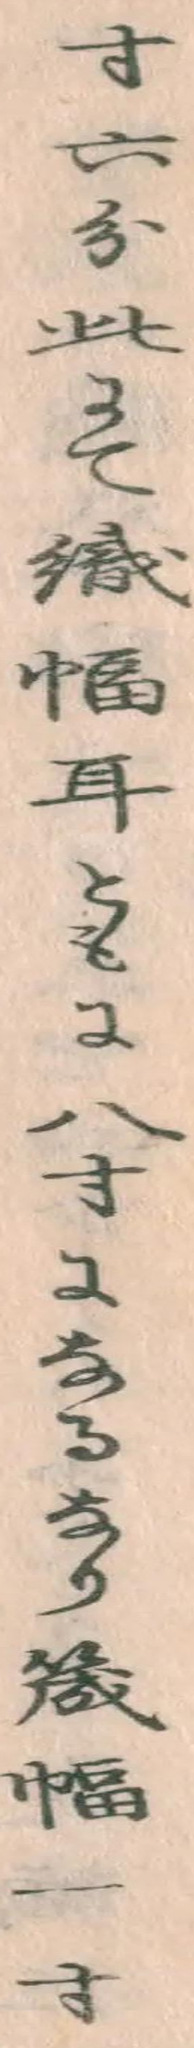寸六分此にて織幅耳ともに八寸になるなり筬幅一寸
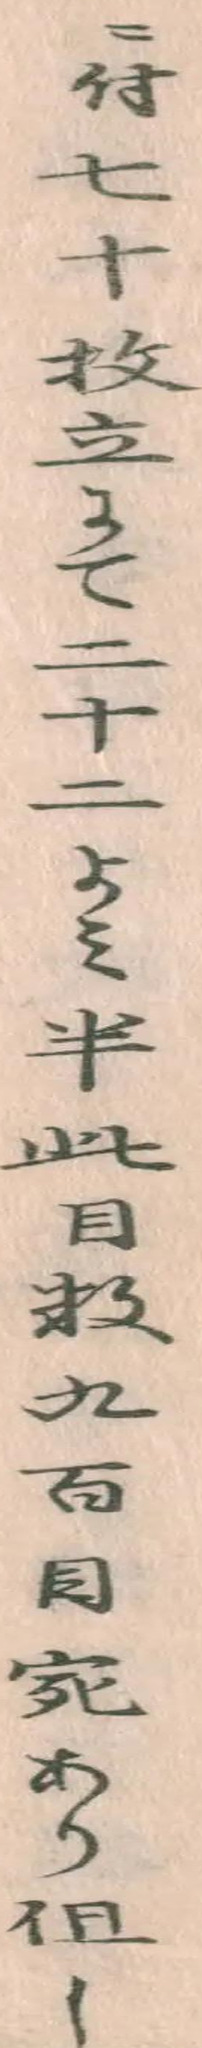に付七十枚立にて二十二よみ半此目数九百目宛あり但し
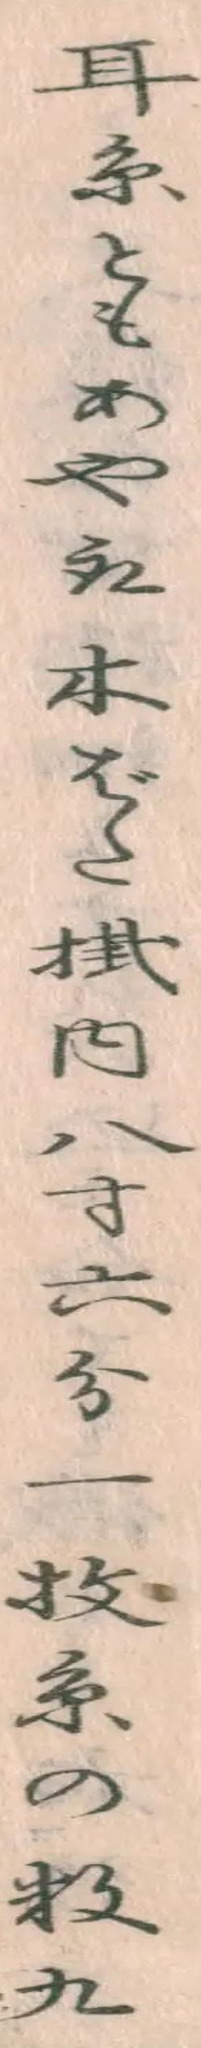耳糸ともあや取木ばた掛内八寸六分一枚糸の数九
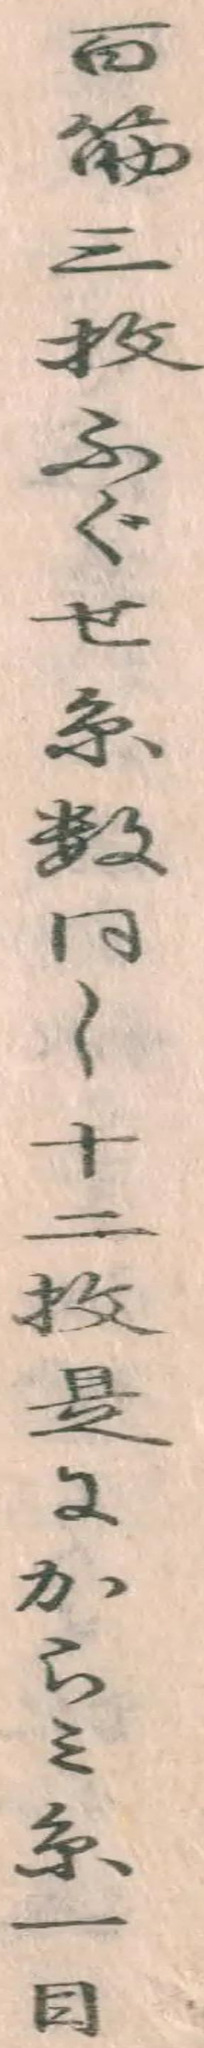百筋三枚ふぐせ糸数同し十二枚是にからみ糸一目
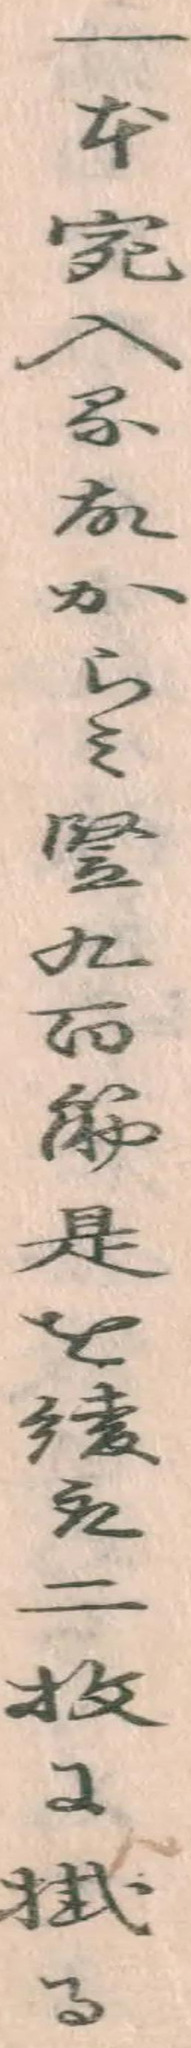一本宛入る故からみ竪九百筋是を綾取二枚に掛る
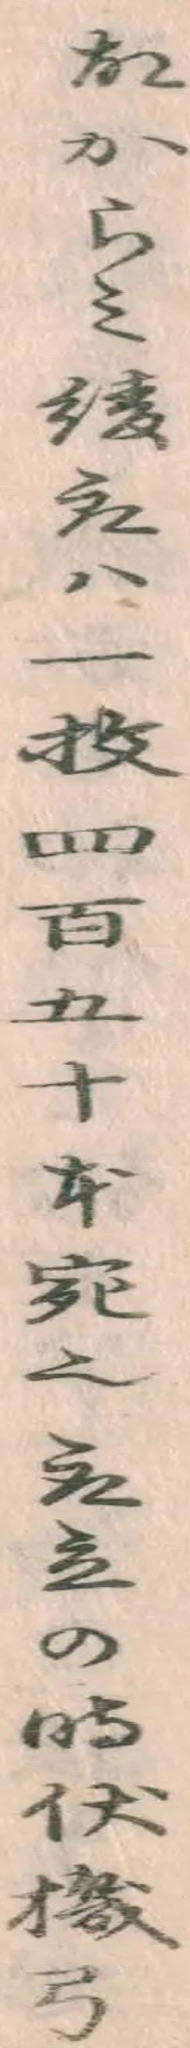故からみ綾取は一枚四百五十本宛也取立の時伏機弓
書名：機織彙編 5巻. [2]
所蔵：国立国会図書館 National Diet Library, JAPAN
